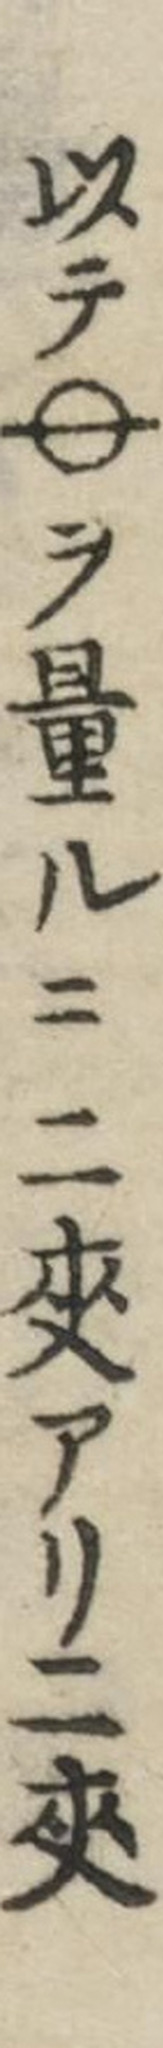以テ◯ヲ量ルニ二夾アリ二夾
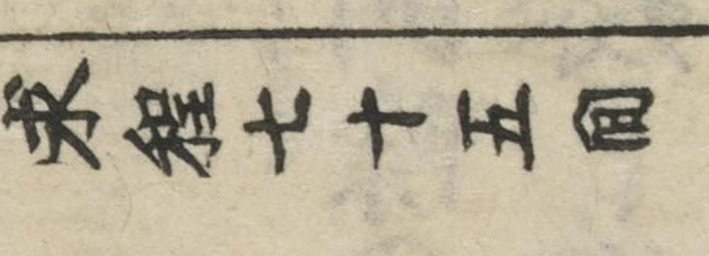求程七十五間
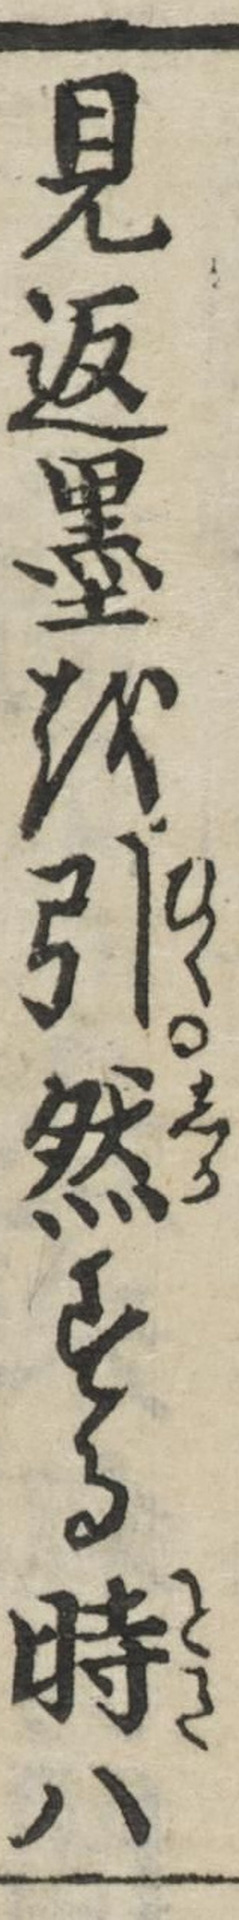見返墨を引。然する時は
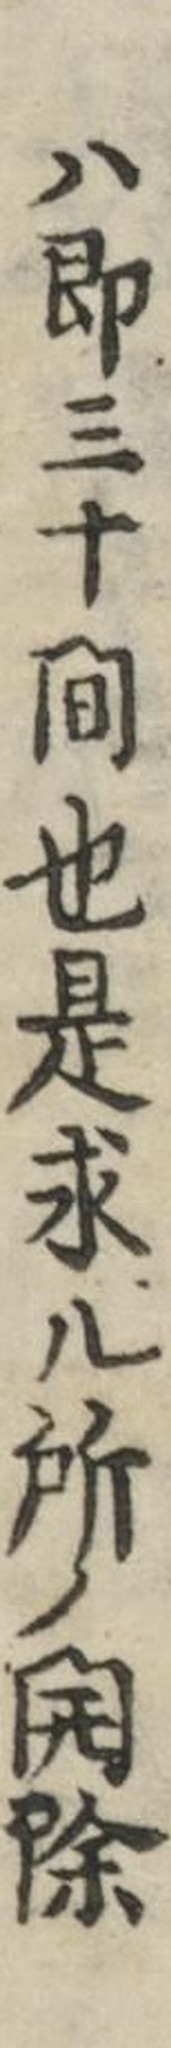ハ即三十間也是求ル所ノ開除
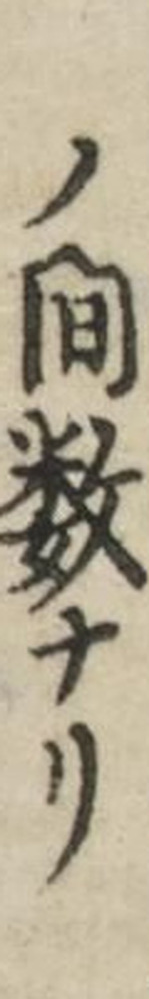ノ間数ナリ
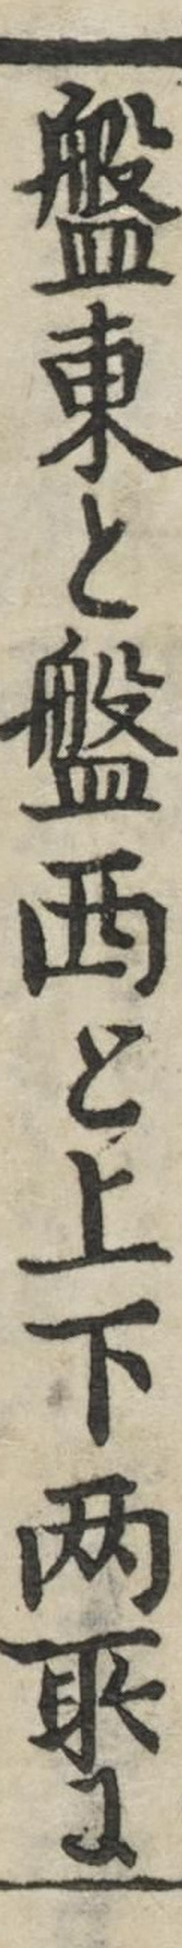盤東と盤西と上下两所に
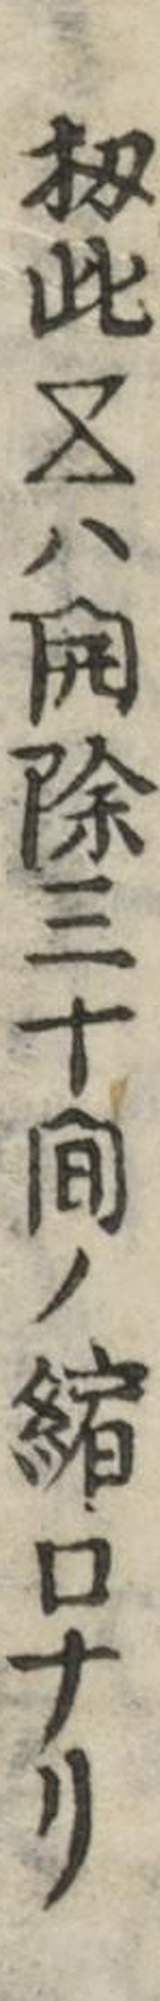扨此▽△ハ開除三十間ノ縮口ナリ
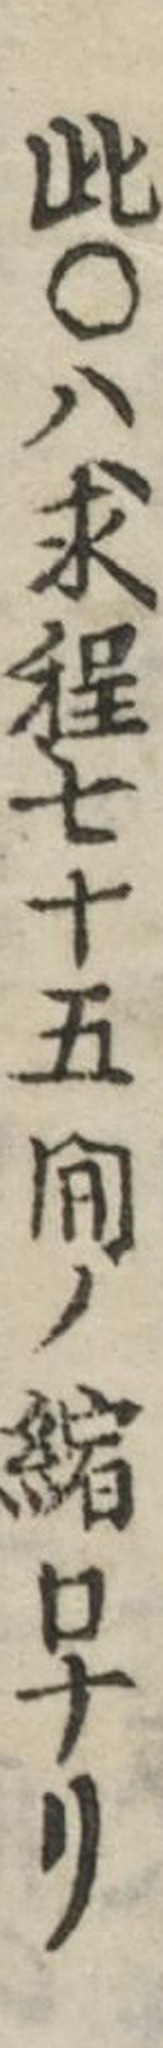此○ハ求程七十五間ノ縮口ナリ
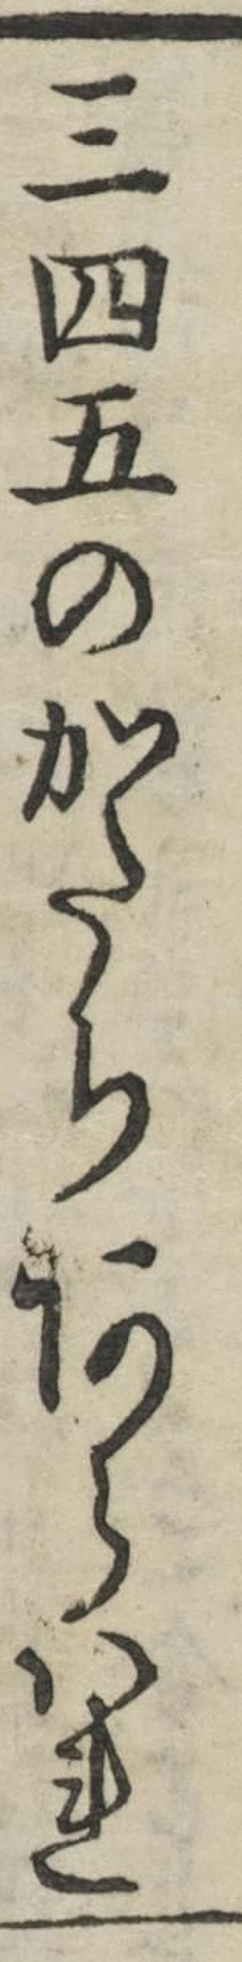三四五のかたちあらはれ
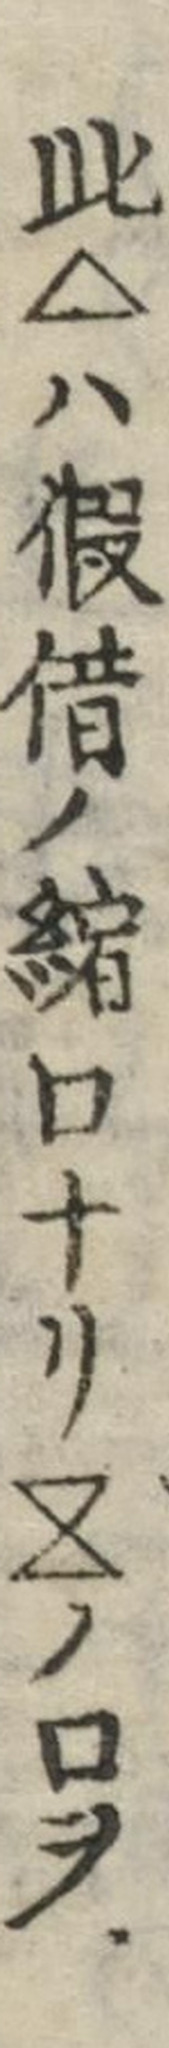此△ハ假借ノ縮口ナリ▽△ノ口ヲ
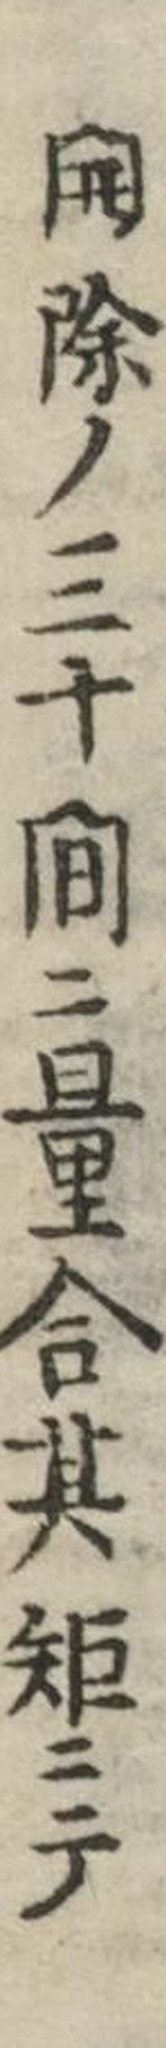開除ノ三十間ニ量合其矩ニテ
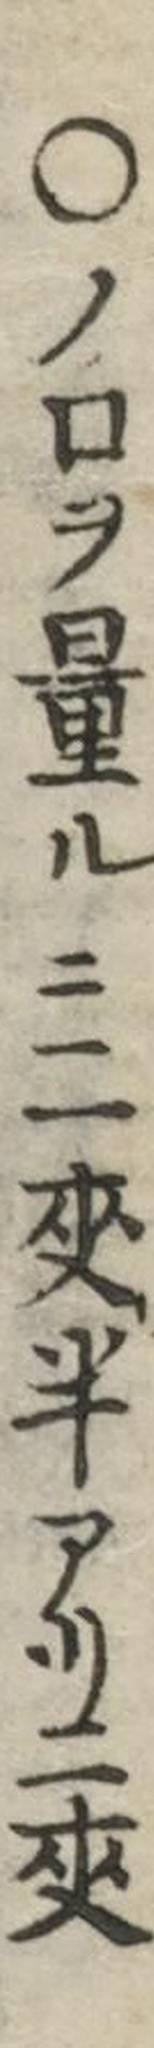○ノ口ヲ量ルニ二夾半アリ二夾
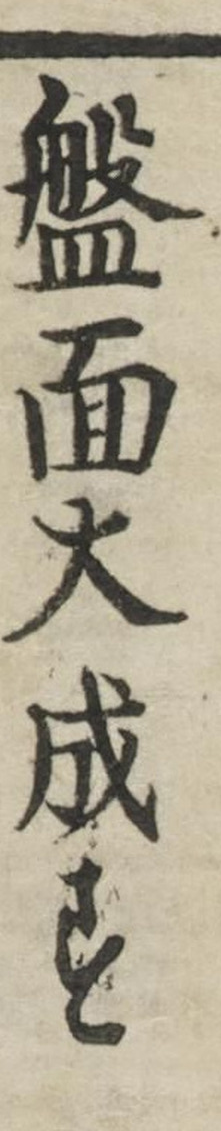盤面大成す
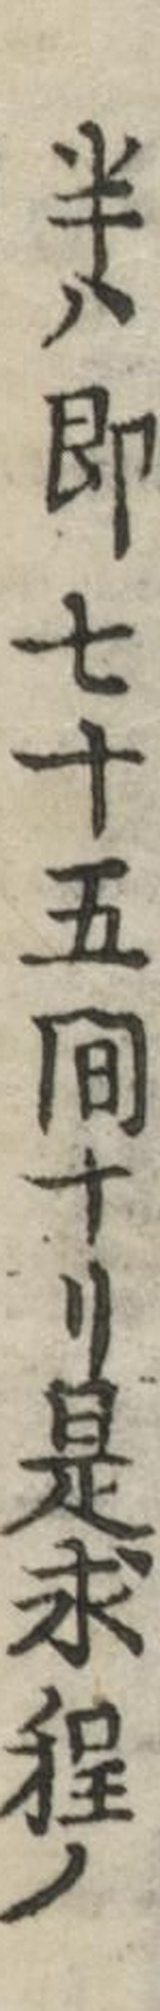半ハ即七十五間ナリ是求程ノ
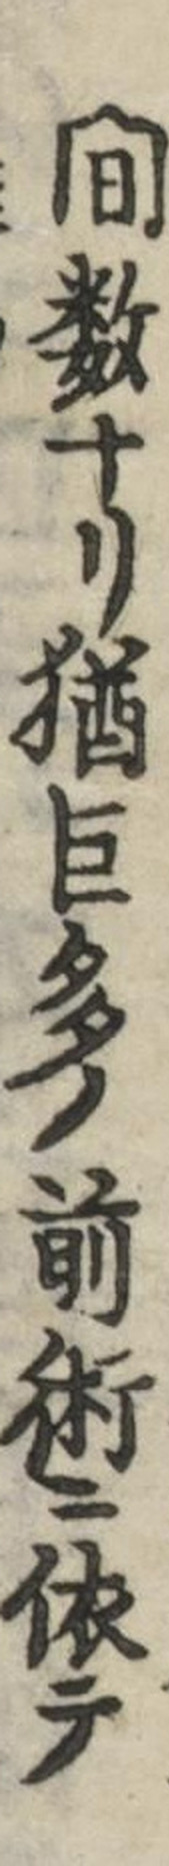間数ナリ猶巨多ノ前術ニ依テ
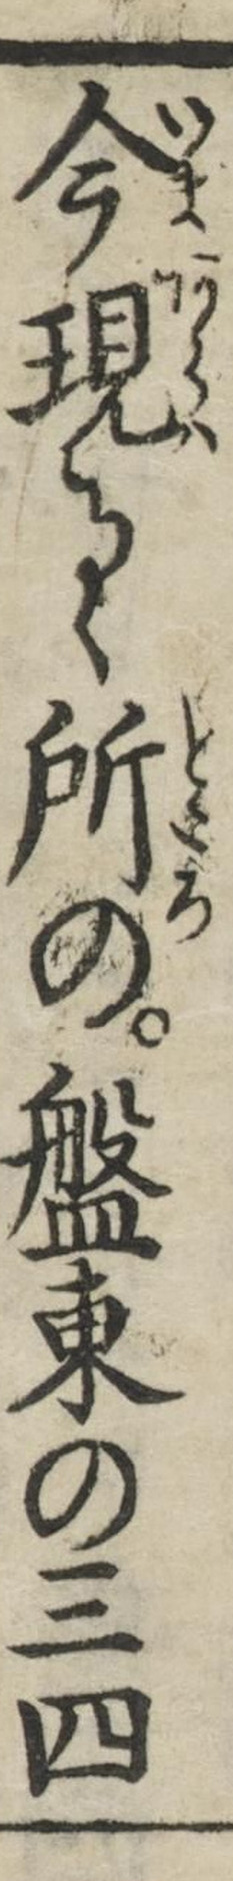今現るヽ所の。盤東の三四
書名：量地指南　巻之二（内題）
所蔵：東京大学地震研究所図書室 Earthquake Research Institute Library, The University of Tokyo, JAPAN
